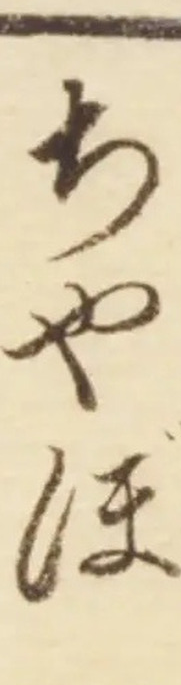ちやぼ

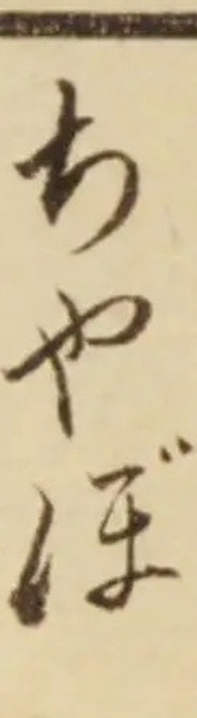ちやぼ
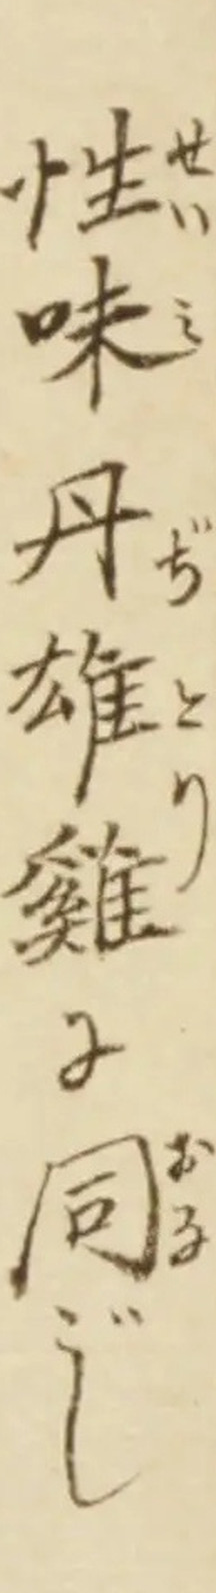性味丹雄鶏に同じ
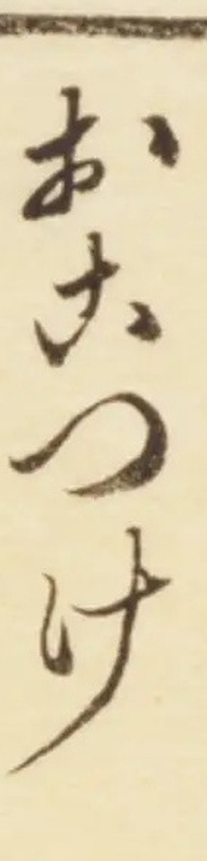おこつけ

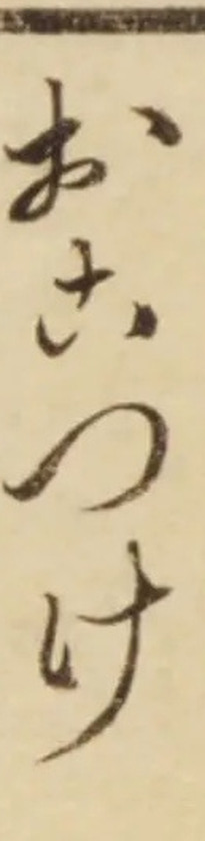おこつけ
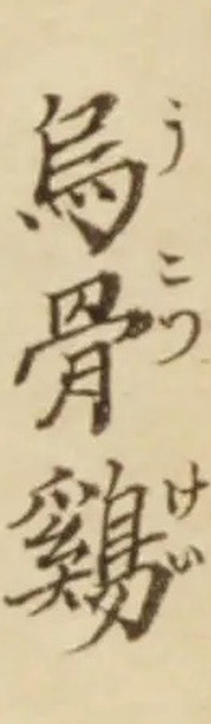烏骨鶏
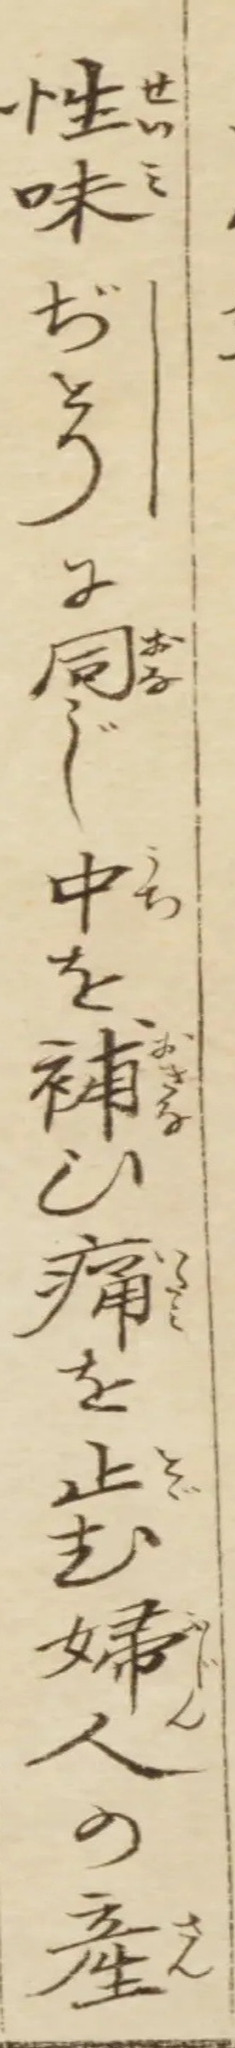性味ぢとりに同じ中を補ひ痛を止む婦人の産
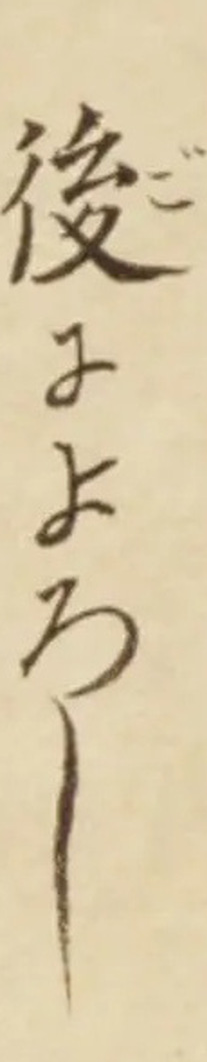後によろし
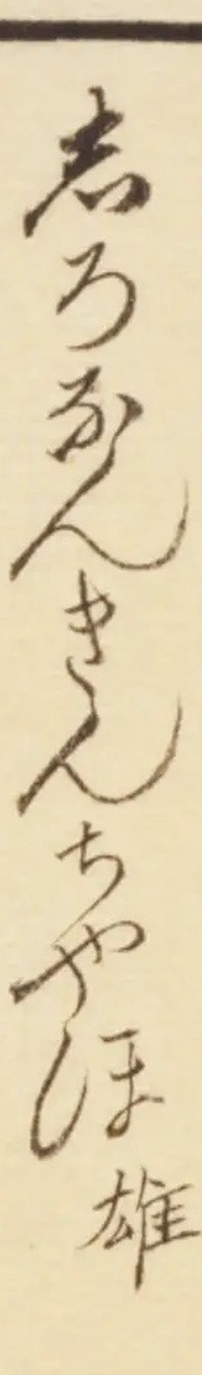しろなんきんちやほ雄

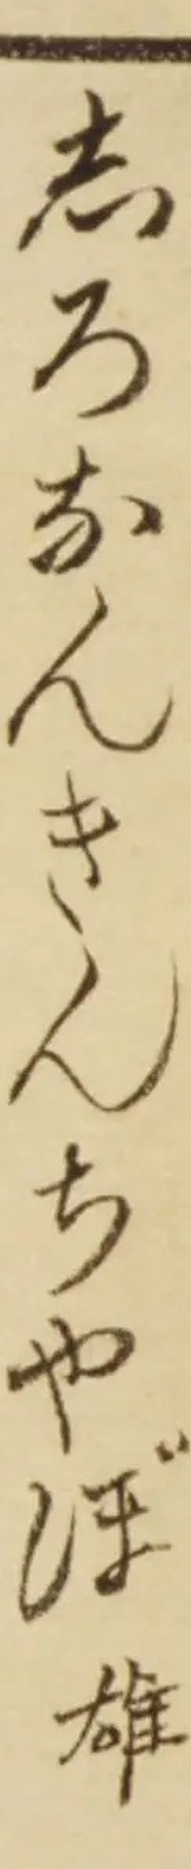しろなんきんちやぼ雄
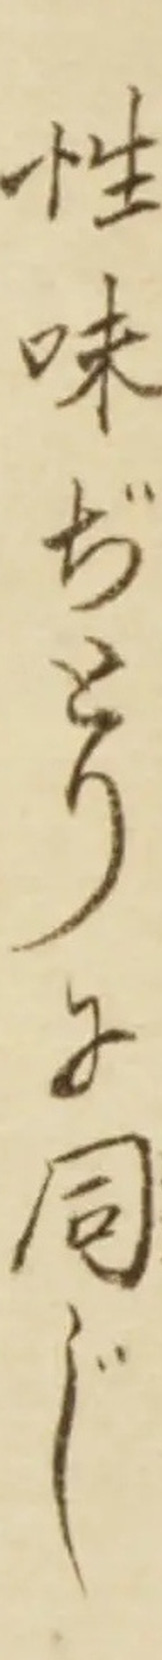性味ぢちりに同じ
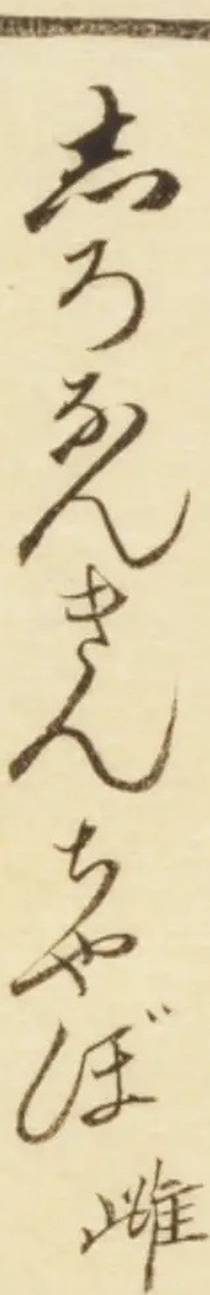しろなんきんちやぼ雌

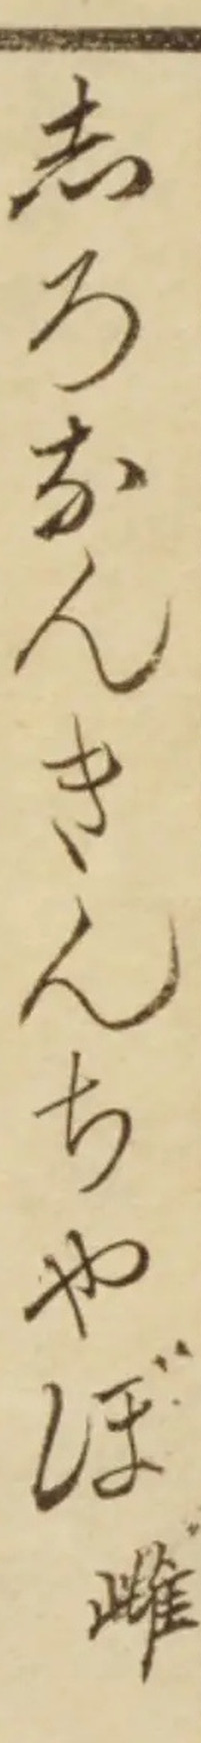しろなんきんちやぼ雌
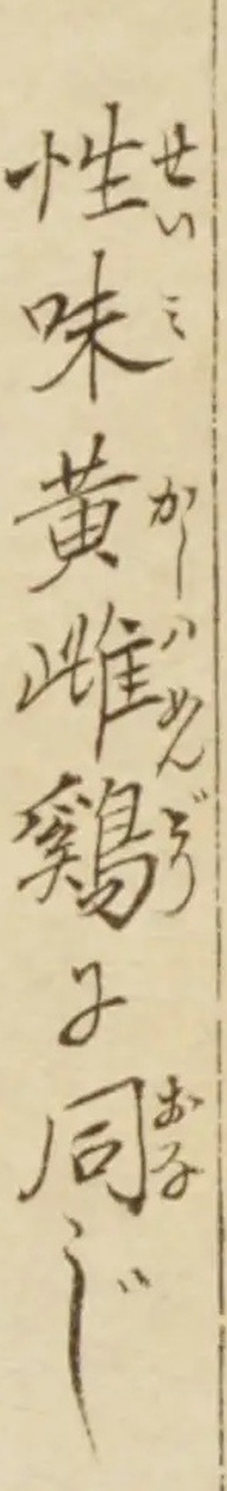性味黄雌鶏に同じ
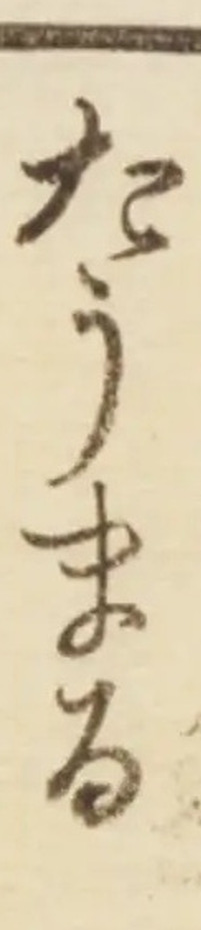たうまる

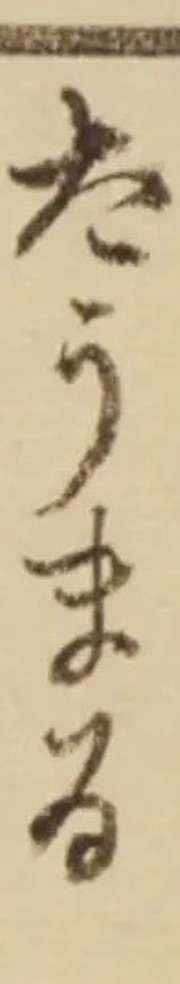たうまる
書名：華鳥譜
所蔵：国立国会図書館 National Diet Library, JAPAN
